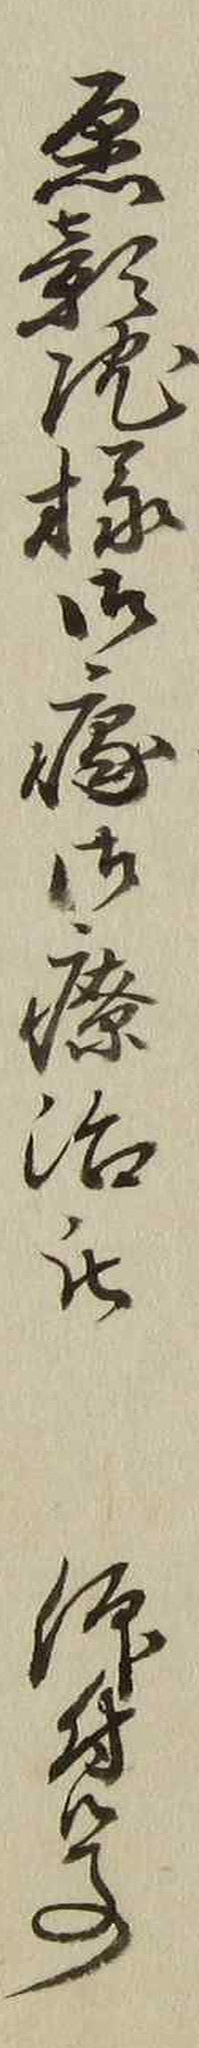愿彰院様御病御療治被仰付候事
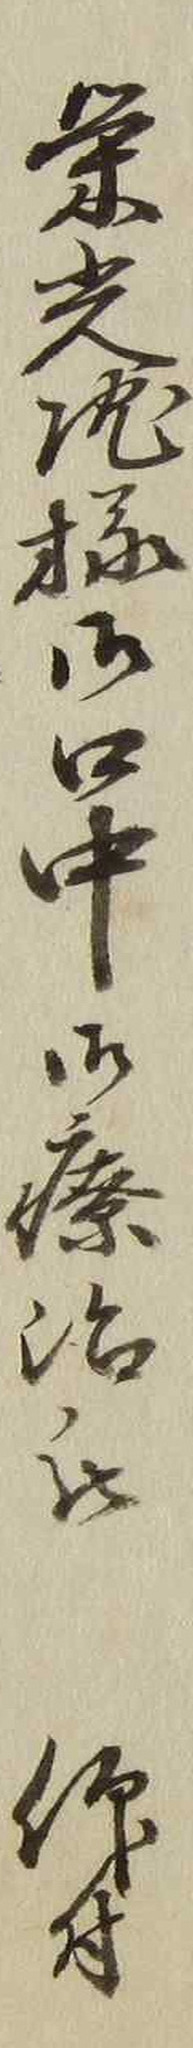栄光院様御口中御療治被仰付
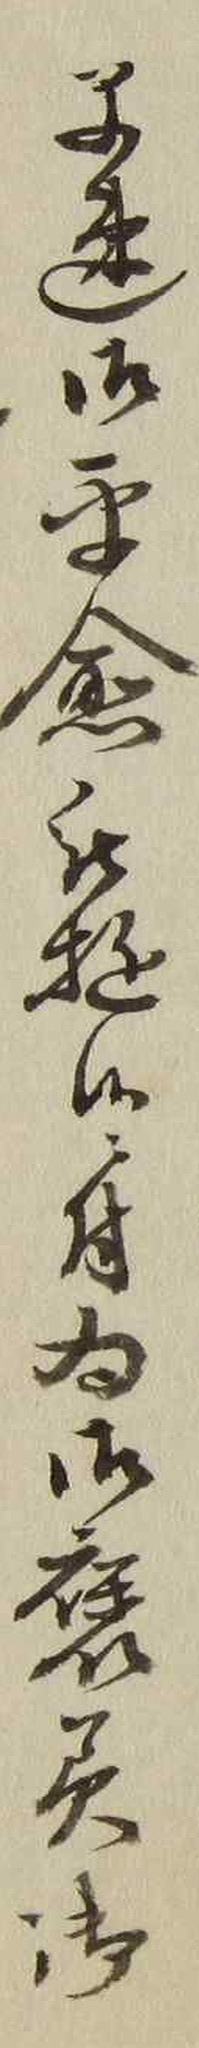早速御平愈被遊候ニ付為御褒美御
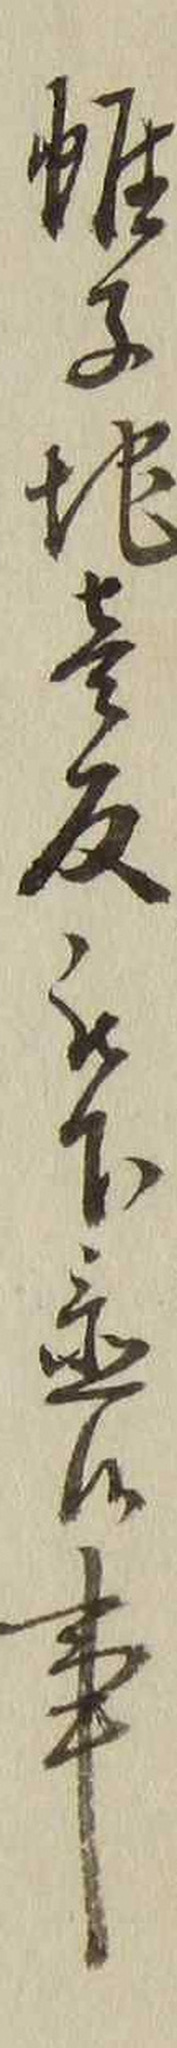帷子地壱反被下置候事
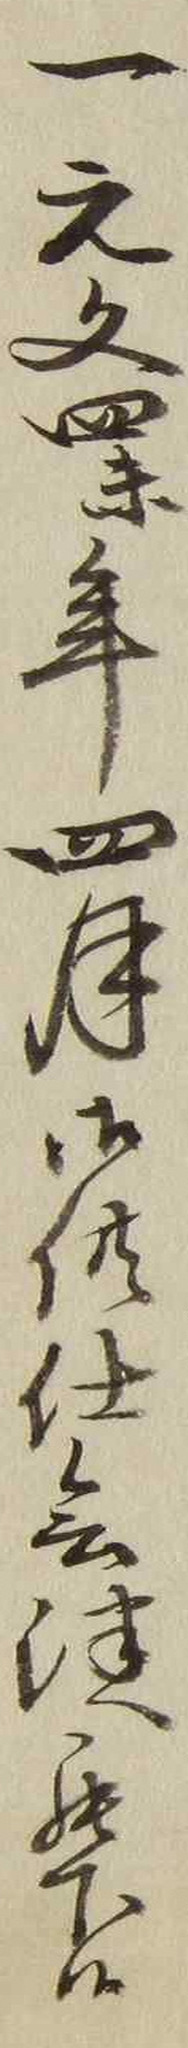一元文四未年四月御供仕会津へ罷下候

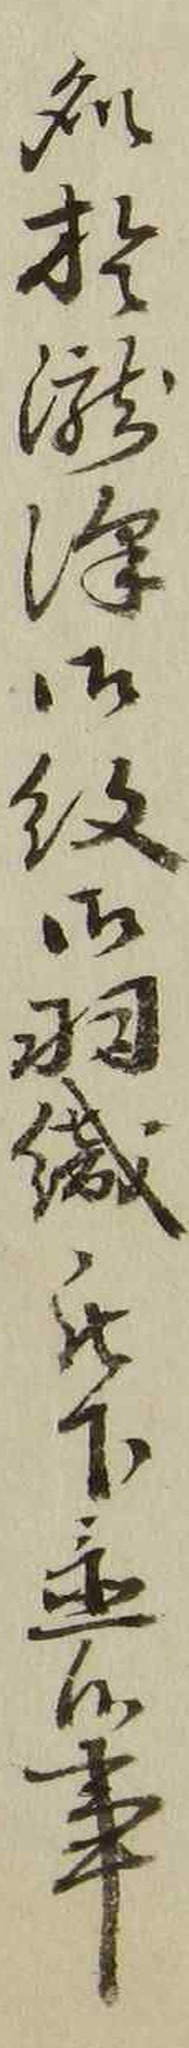処於瀧沢御紋御羽織被下置候事
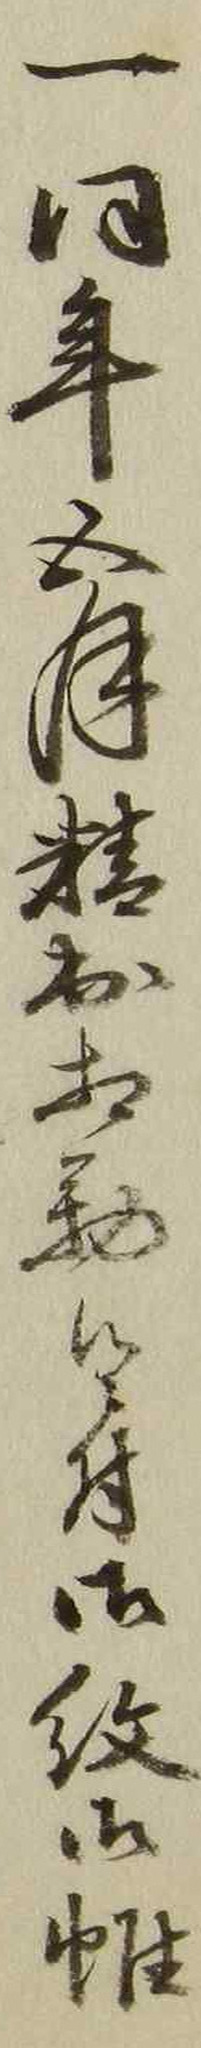一同年五月精出相勤候ニ付御紋御帷
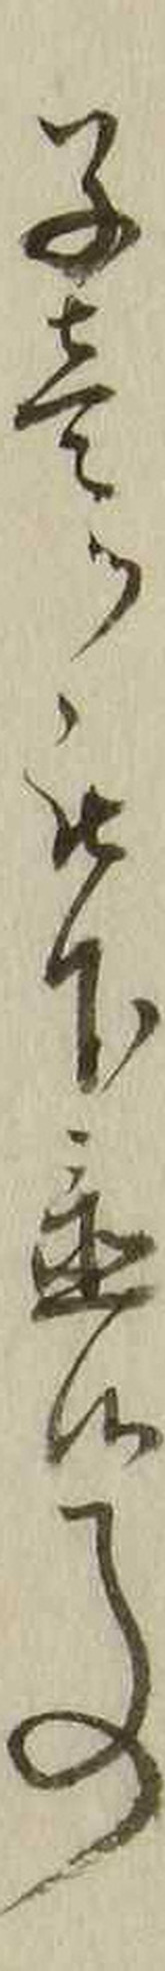子壱ツ被下置候事
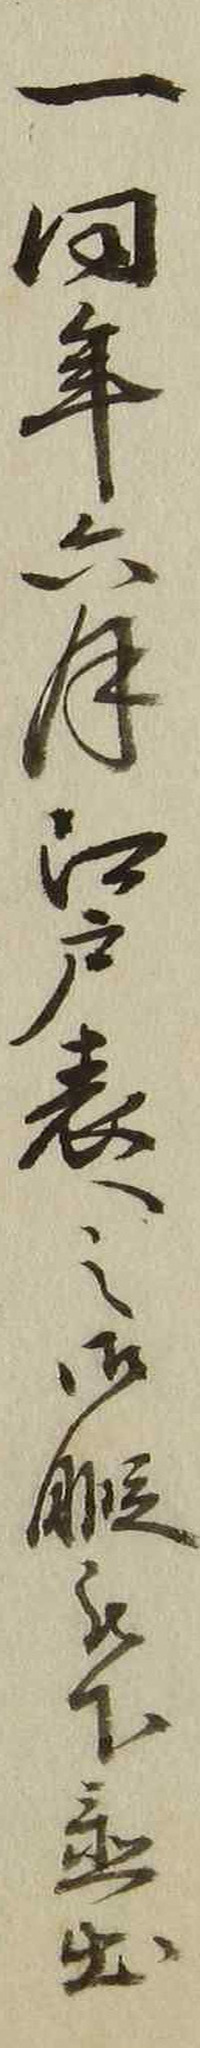一同年六月江戸表へ之御暇被下置出
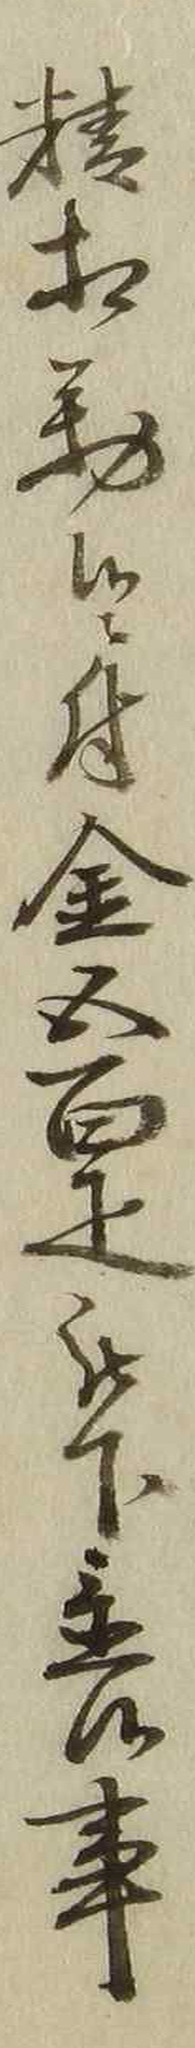精相勤候ニ付金五百疋被下置候事
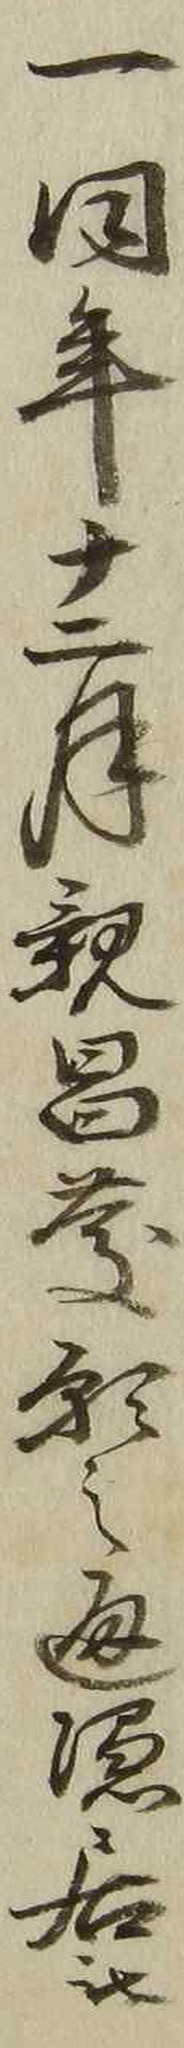一同年十二月親昌慶願之通隠居被
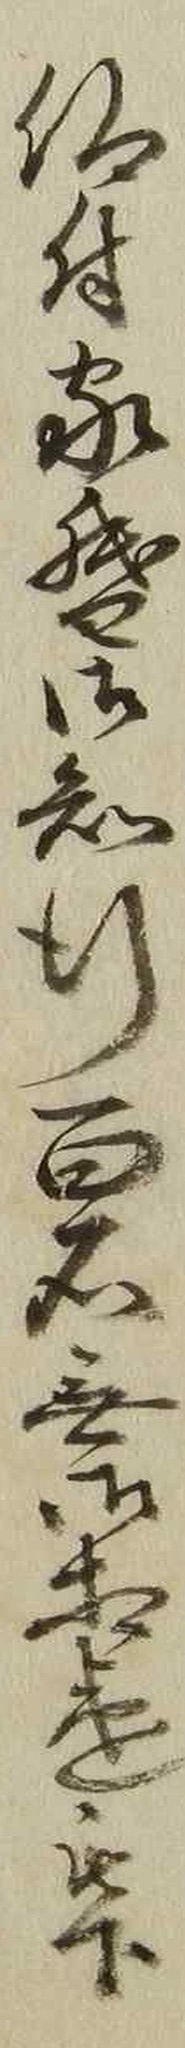仰付家督御知行百石無御相違被下
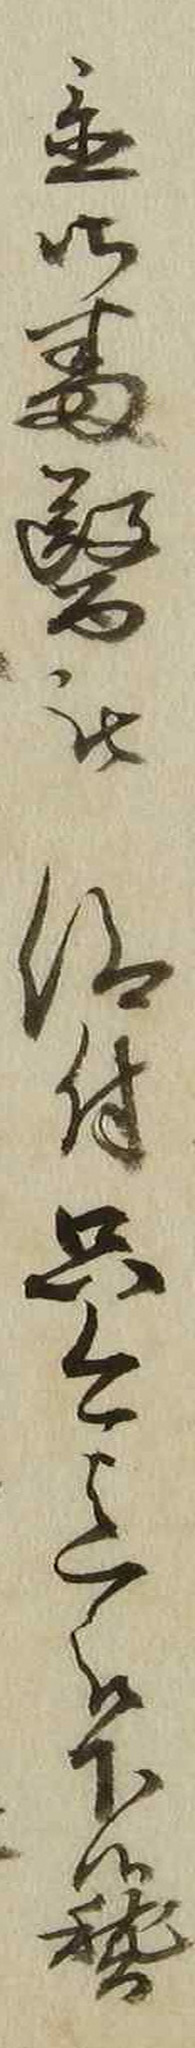置御番医被仰付只今迄被下候稽
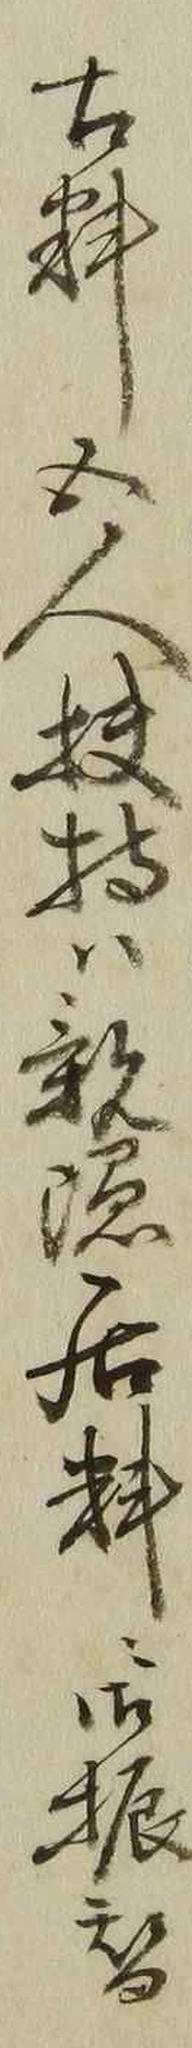古料五人扶持ハ親隠居料ニ御振替
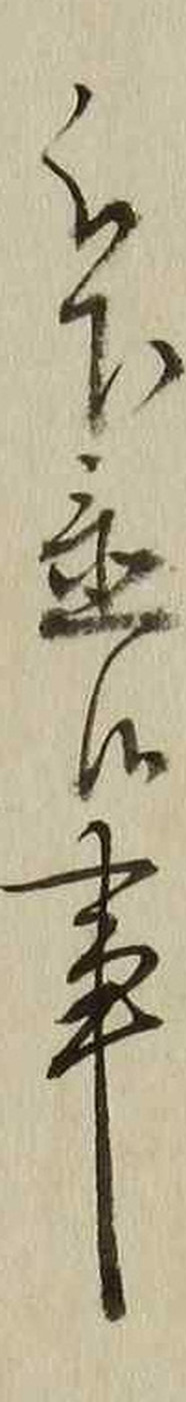被下置候事
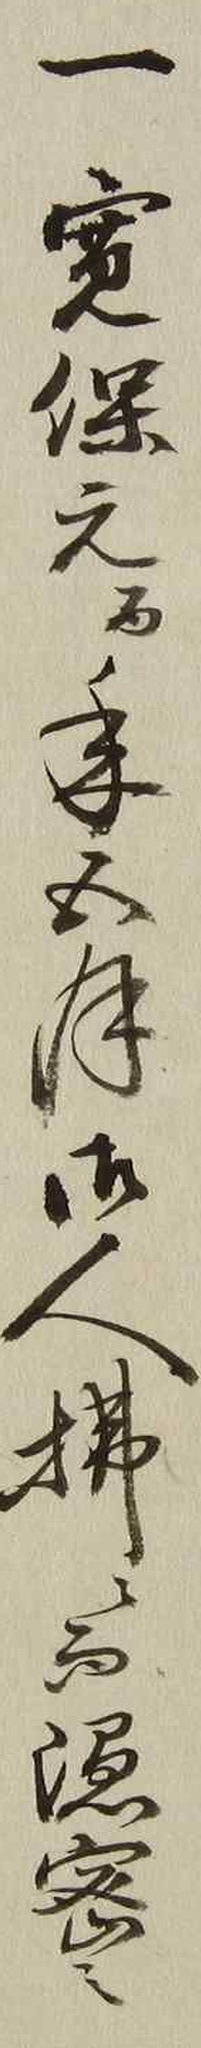一寛保元酉年五月御人払ニ而隠密之
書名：諸士系譜　巻之31　い之部31
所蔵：会津若松市立会津図書館
